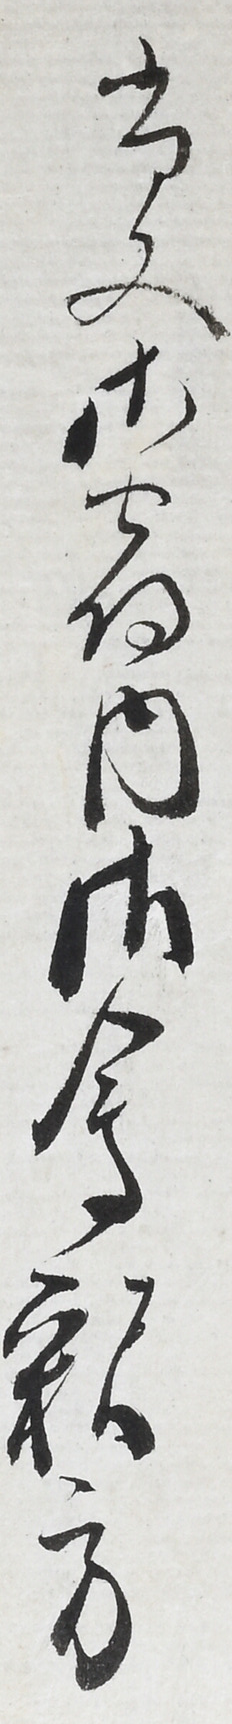尚又御宿内御会釈方
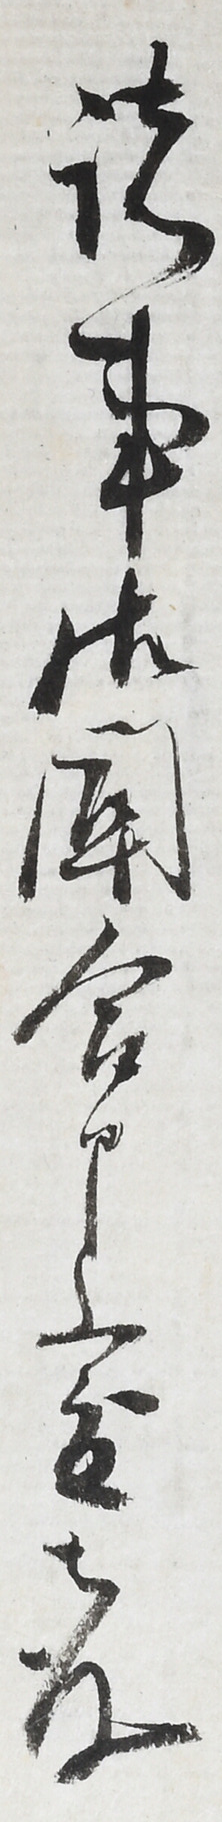諸事御聞合申上度奉存
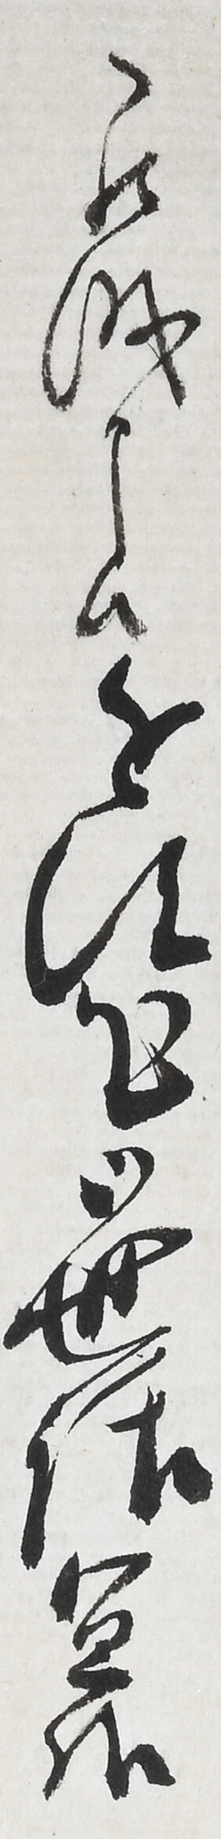罷越申候近頃乍御世話宜様
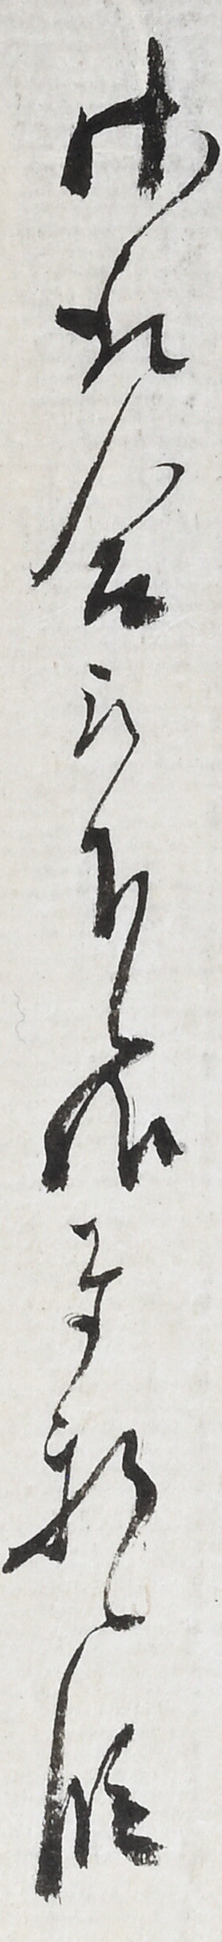御取合被下候様奉願候段
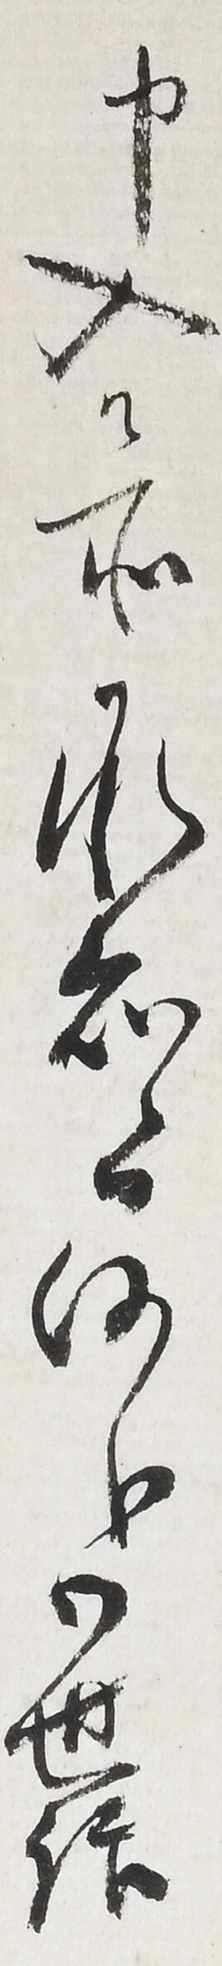申入候所承知ニ而何分御世話
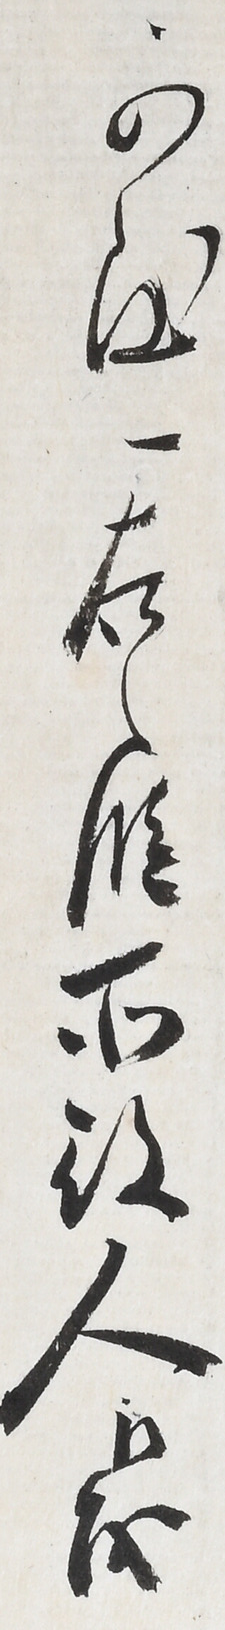可致候右之段所役人えも
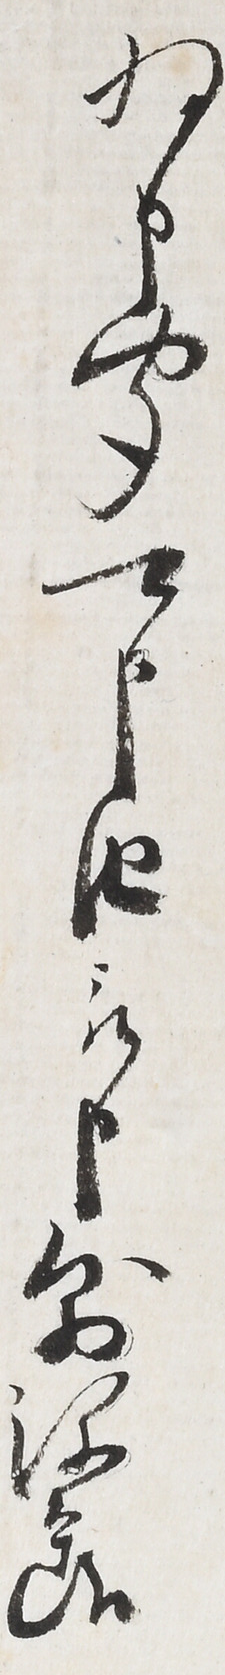為申聞可申由被申則弥平治
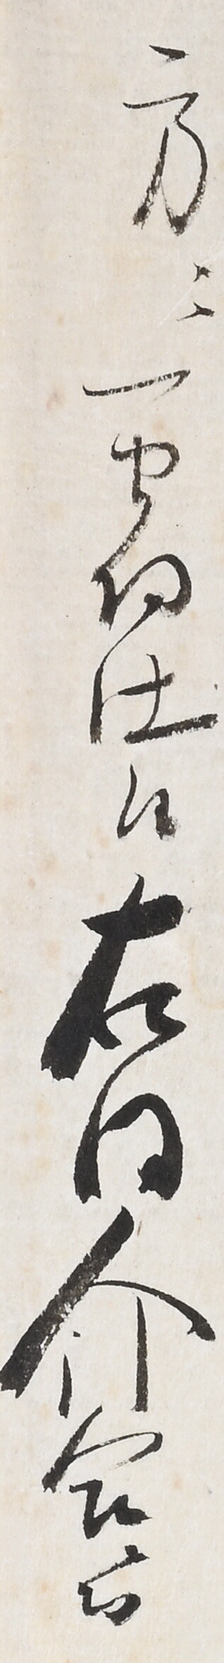方ニ一宿仕候右同人引合ニ而
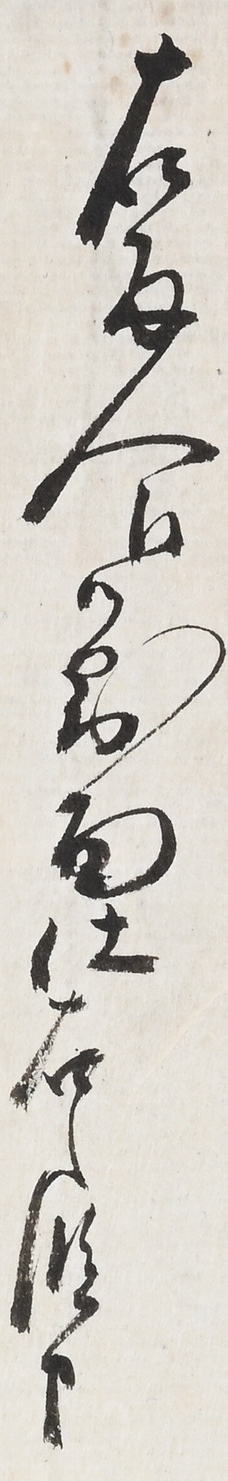右両人え御対面仕右之段申
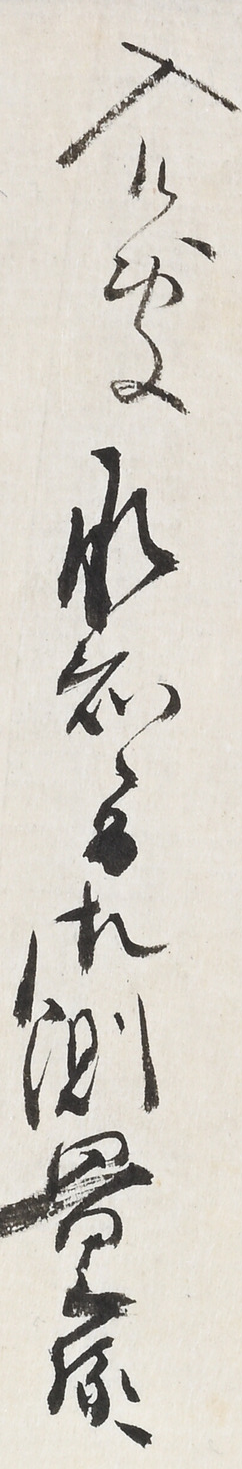入候処承知ニ而御測量様へ
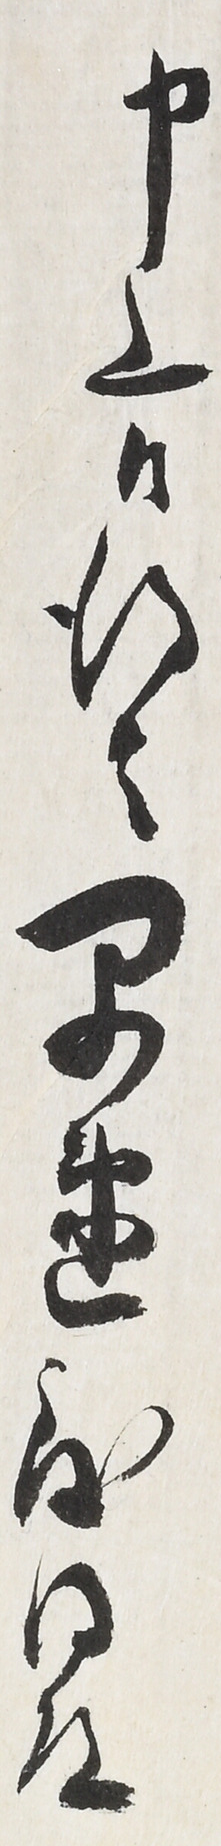申上候得は早速致同道
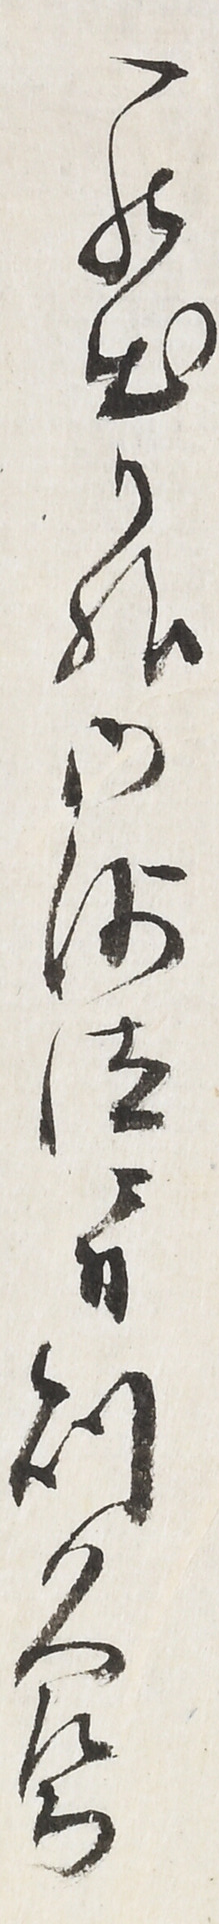罷出候様御沙汰ニ付則久左衛門
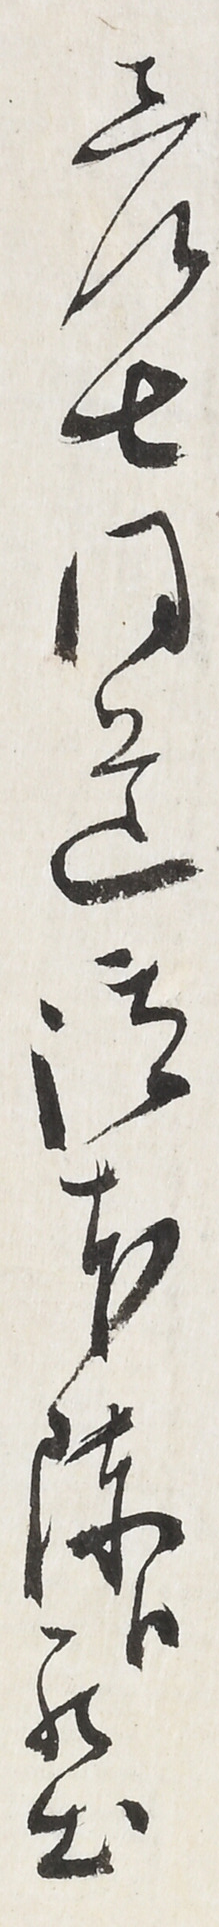彦七同道御本陣え罷出
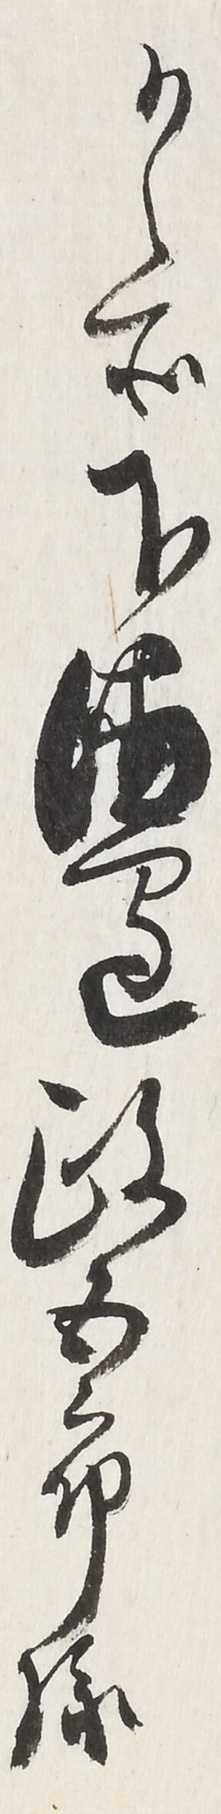候之所下河辺政五郎様
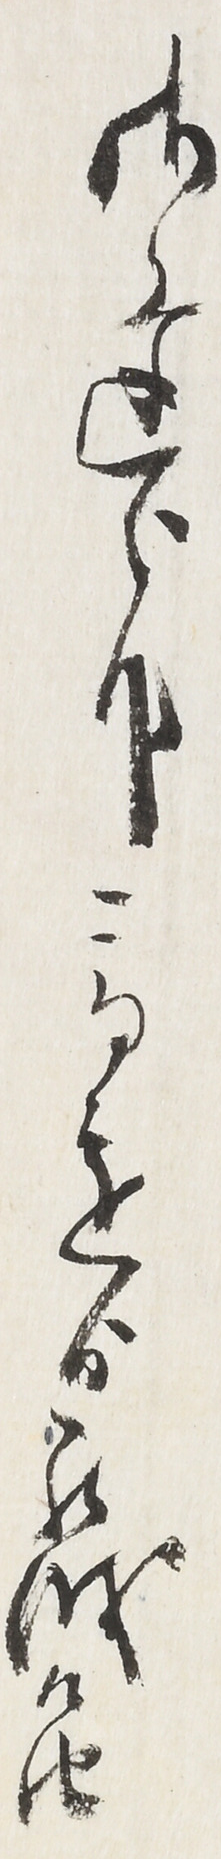御逢被下高遠ゟ罷越候由

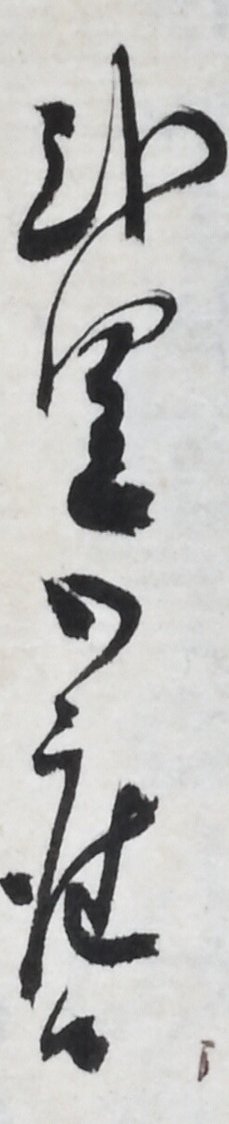弐里御座候
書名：御測量方御出ニ付三州迄罷出御窺聞合覚書
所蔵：伊那市立高遠町図書館・合同会社AMANE
